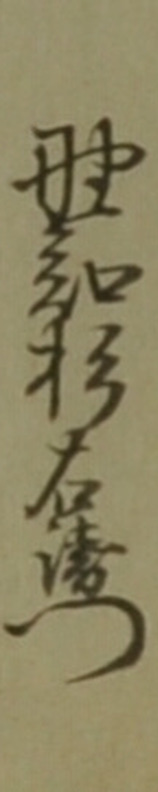野知杉右衛門
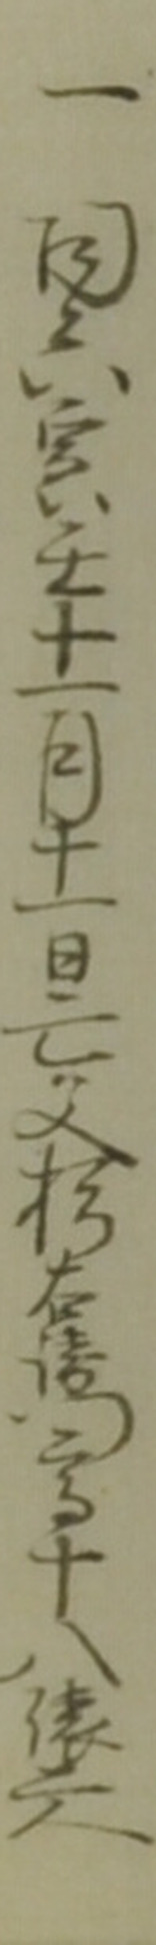一同六寅閏十一月十一日亡父杉右衛門高十八俵二人
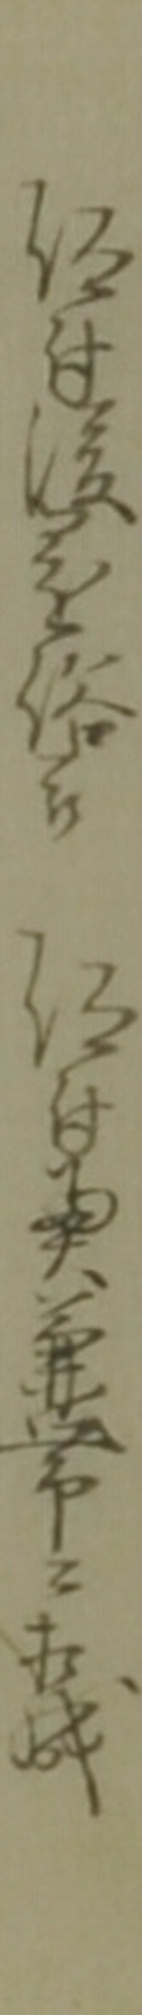仰付後還俗被仰付奥兼帯相成

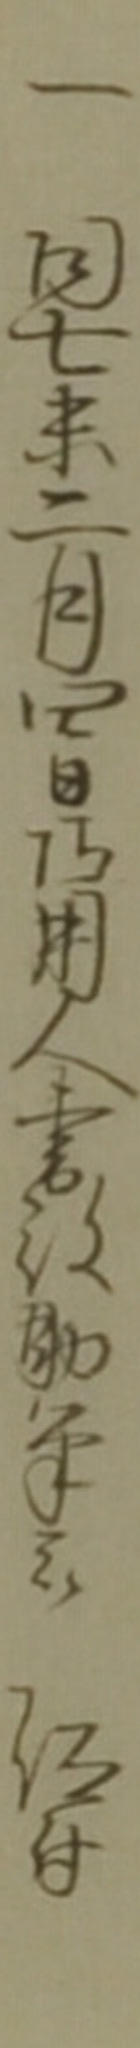一同七未二月四日御用人書役助筆被仰付
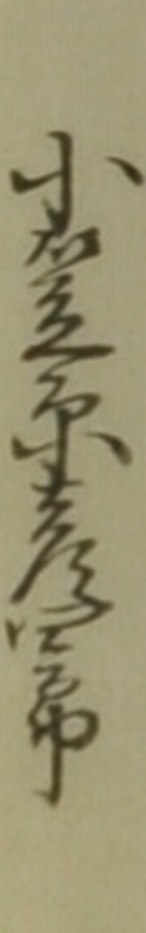小笠原彦四郎

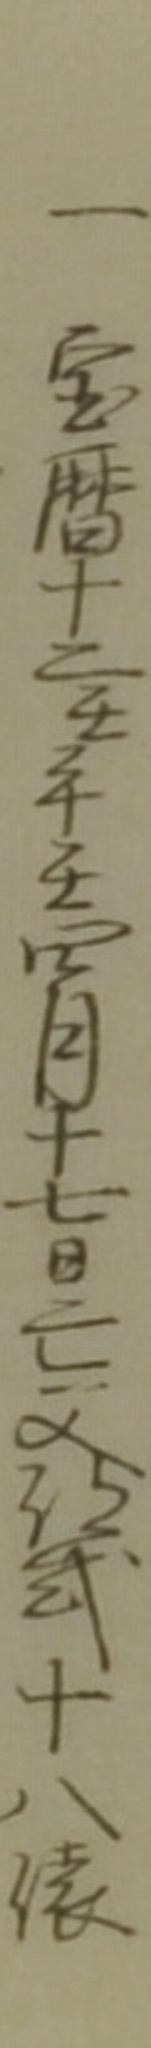一宝暦十二壬午閏四月十七日亡父跡式十八俵
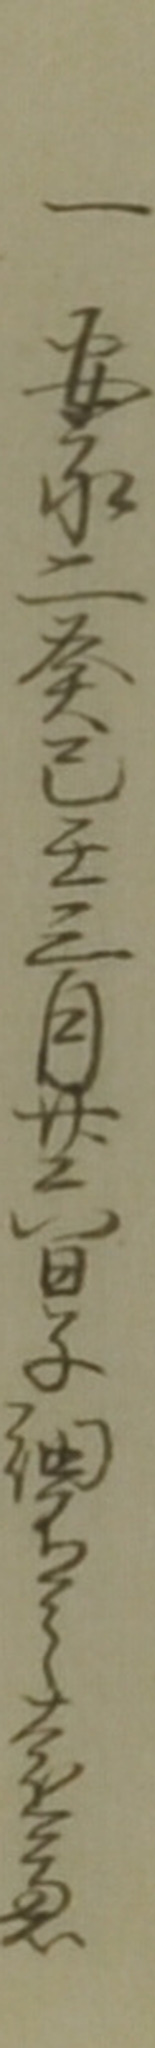一安永二癸巳閏三月廿六日子細有之遠慮
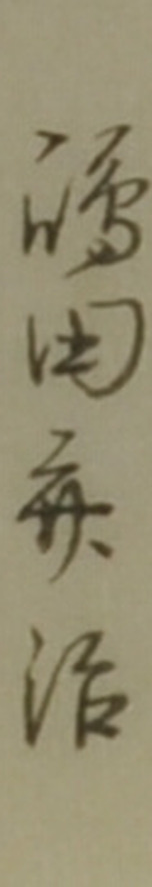嶋田弁治

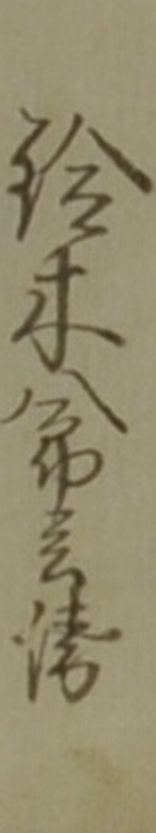鈴木八郎兵衛

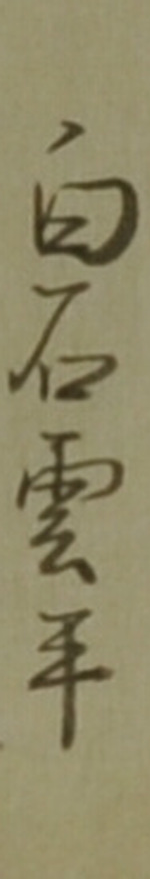白石雲平
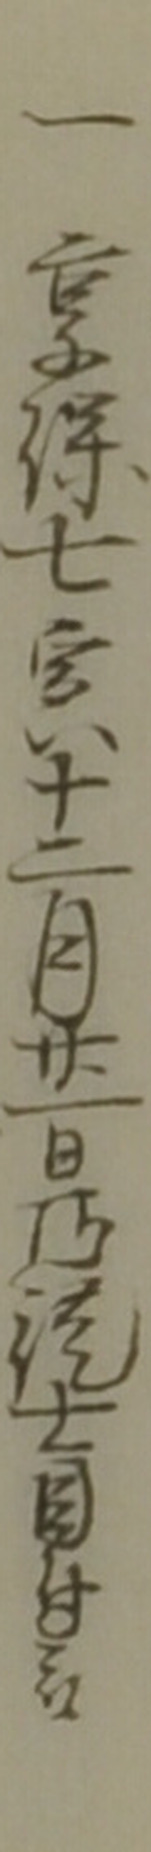一享保七寅十二月廿一日御徒士目付被
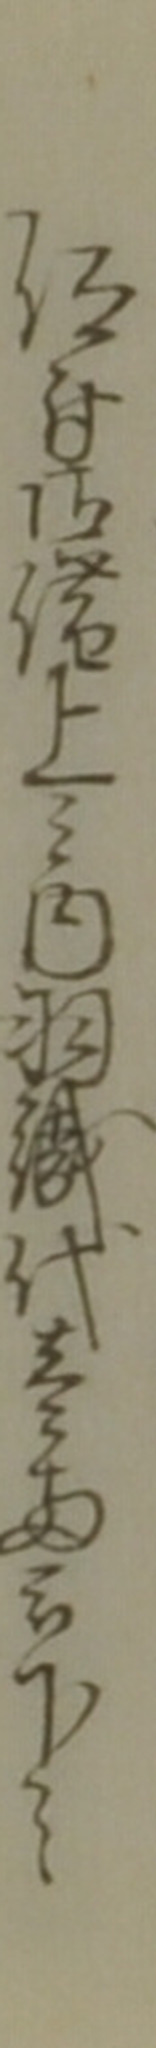仰付御借上之内羽織代壱両被下之
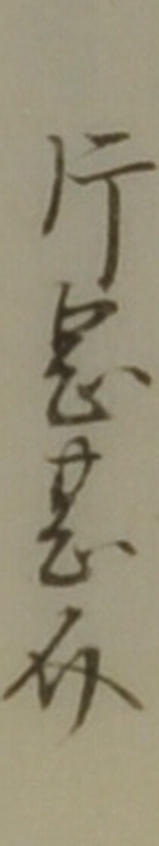片岡甚介
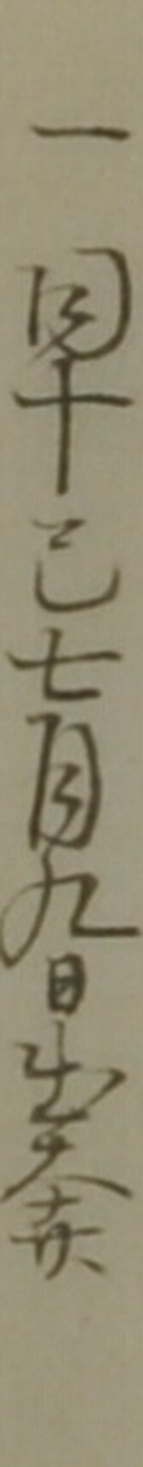一同十巳七月九日出奔
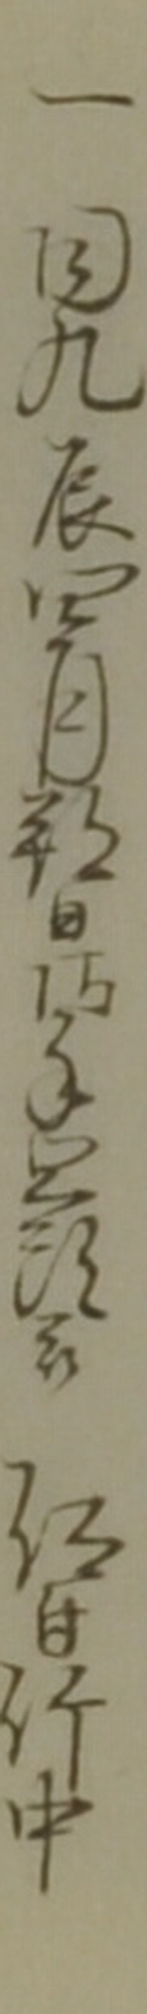一同九辰四月朔日御手廻頭被仰付竹中
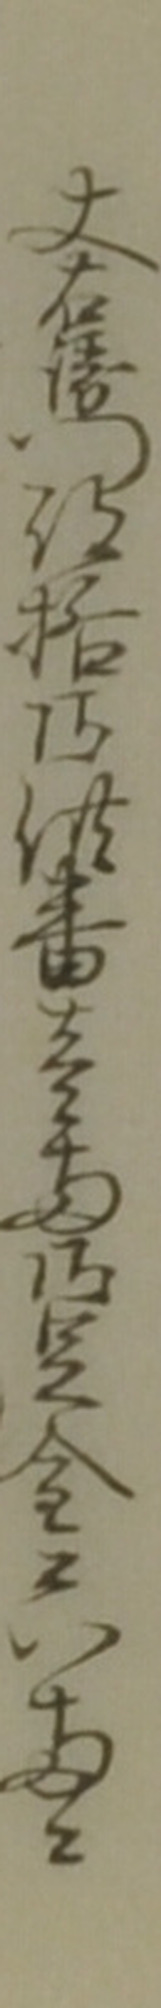丈右衛門跡格御供番壱両御足金六両
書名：無足廃家（壱）
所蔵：伊那市立高遠町図書館・合同会社AMANE
